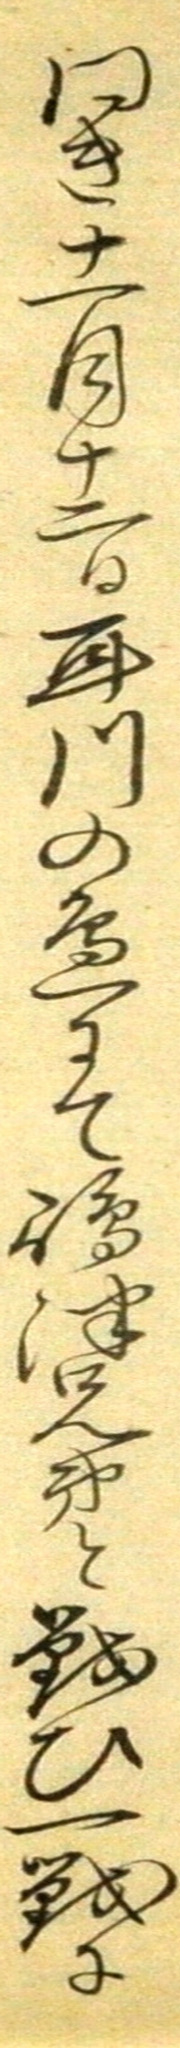同き十一月十二日耳川の辺にて島津兄弟と戦ひ一戦に
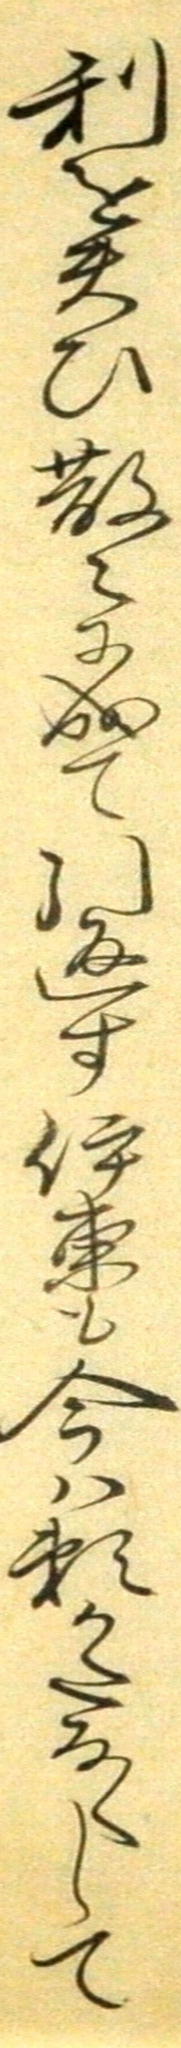利を失ひ散々に成て引返す伊東も今は頼かたなくして
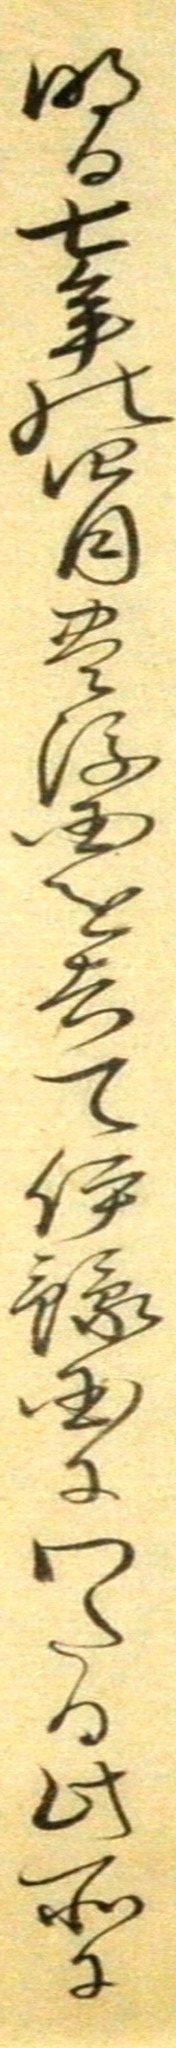明る七年の四月豊後国を去て伊予国にわたる此所
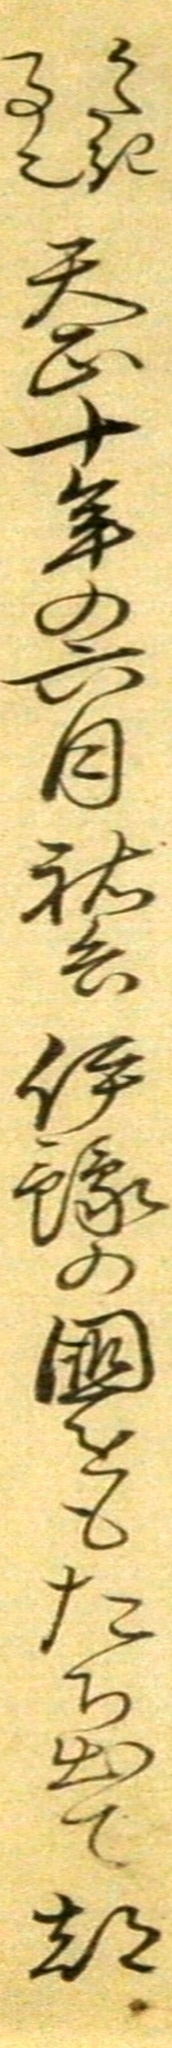かたき事也天正十年の六月祐兵伊予の国をもたち出て都
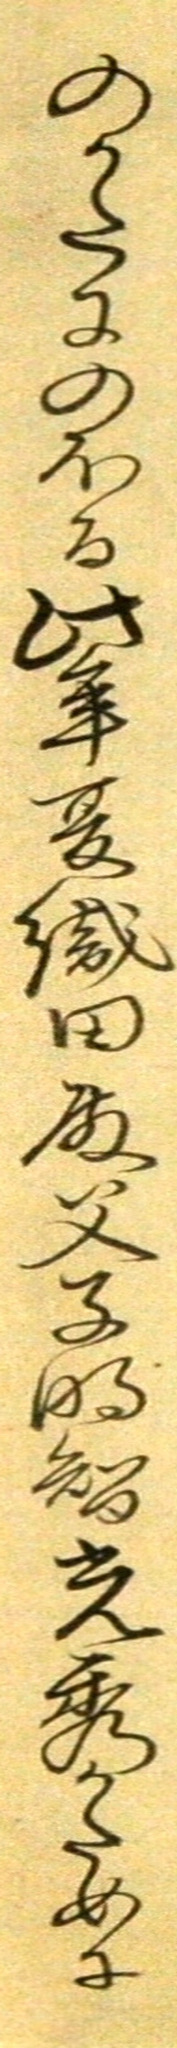のかたにのほる此年夏織田殿父子明智光秀かために

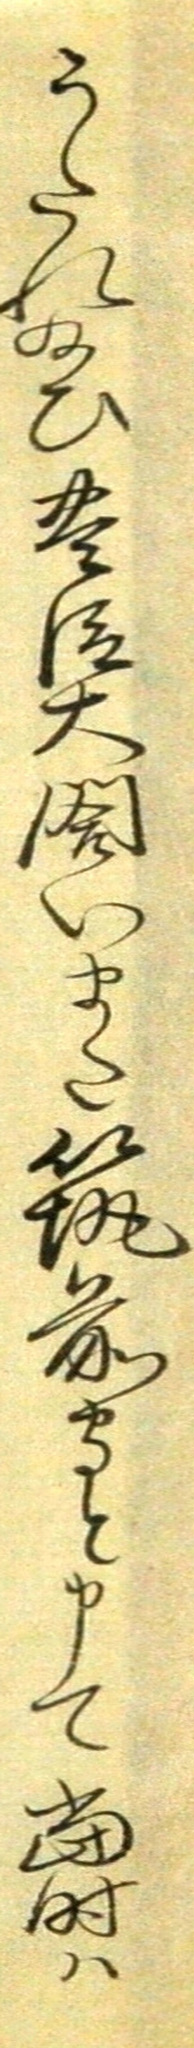うたれ給ひ豊臣太閤いまた筑前守と申て当時は
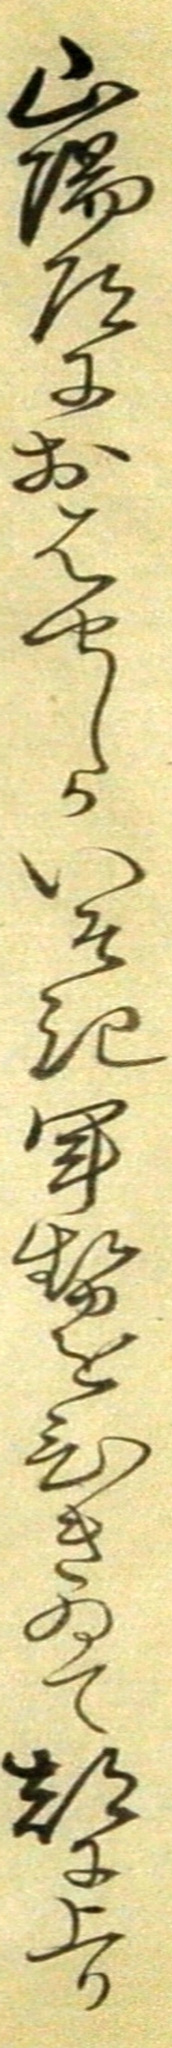山陽道におはせしかいそき軍勢をひきゐて都に上り
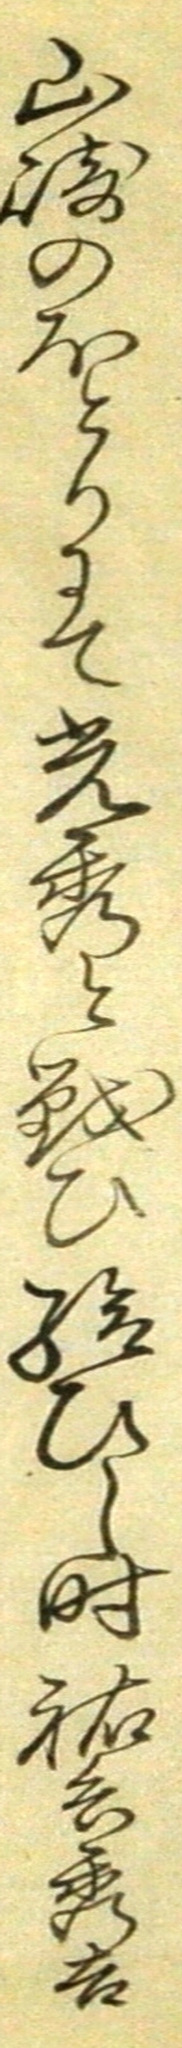山崎のほとりにて光秀と戦ひ給ひし時祐兵秀吉
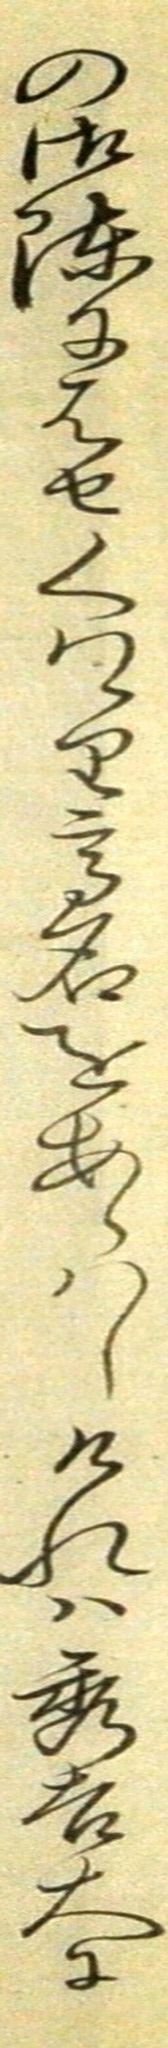の御陣にはせくはゝり高名をあらはしけれは秀吉大に
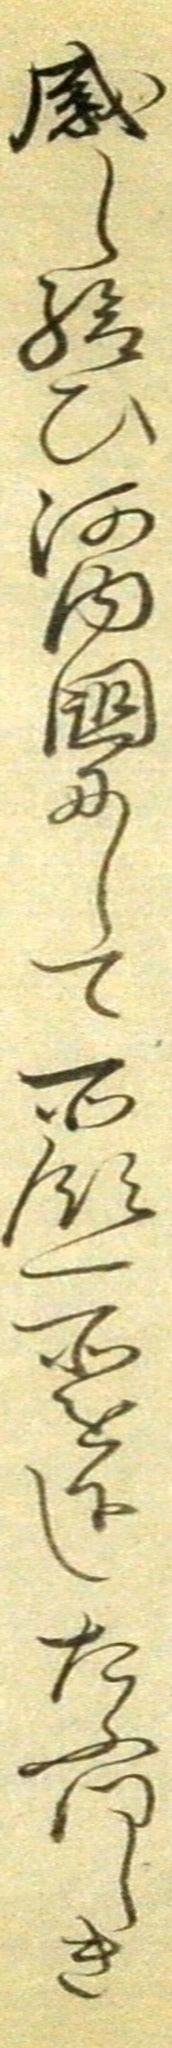感し給ひ河内国にして所領一所を下したふ同しき
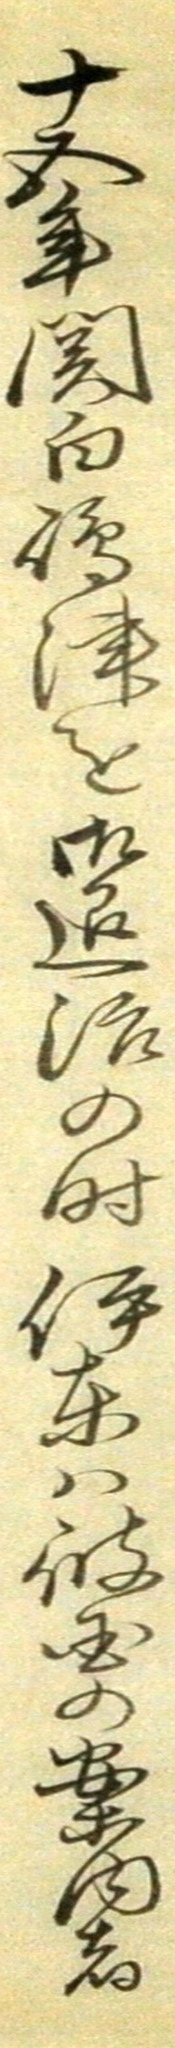十五年関白島津を御退治の時伊東は彼国の案内者
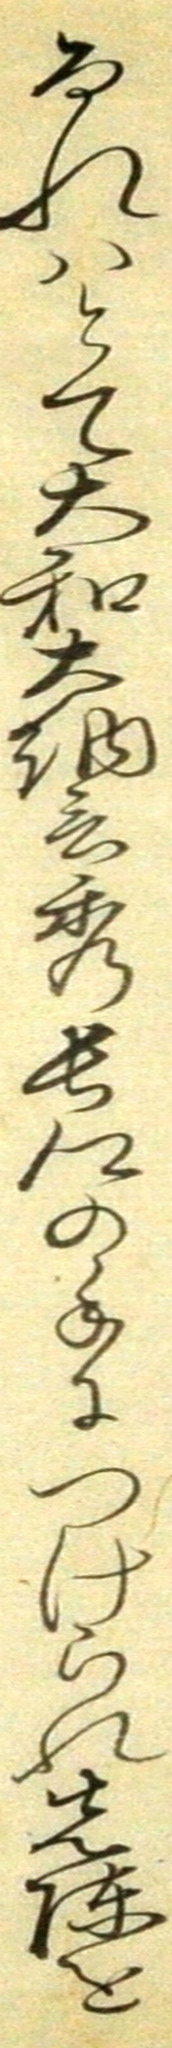なれはとて大和大納言秀長卿の手につけられ先陣を
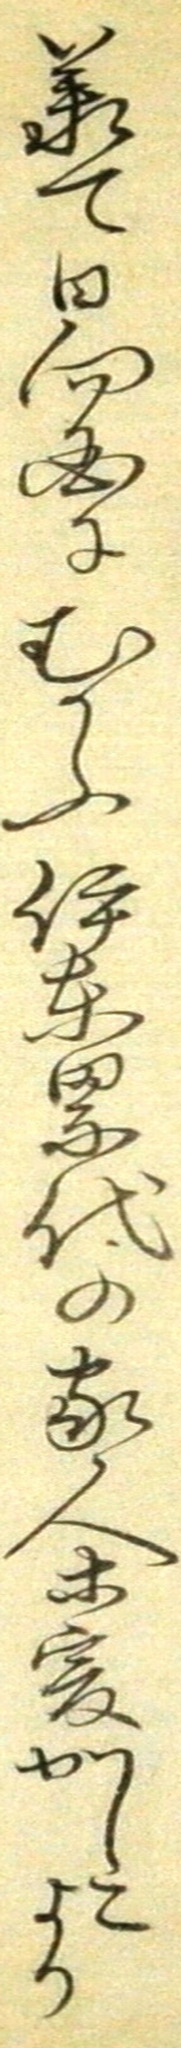承て日向国にむかふ伊東累代の家人等爰かしこより
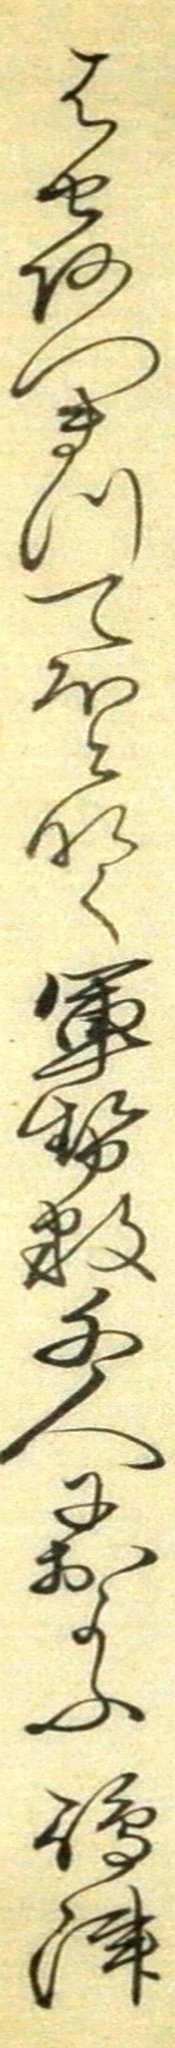はせあつまつてほとなく軍勢数千人におよふ島津
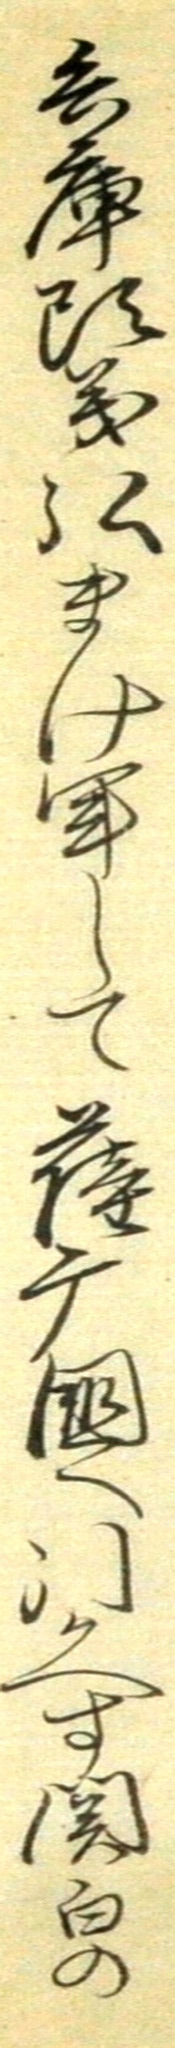兵庫頭義弘まけ軍して薩摩国へ引かへす関白の
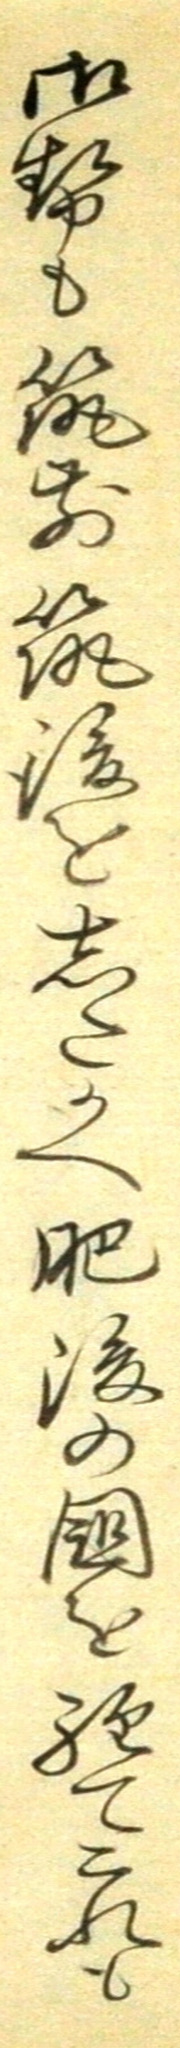御勢も筑前筑後をしたかへ肥後の国を経てこれも
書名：藩翰譜（九・下）
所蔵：伊那市立高遠町図書館・合同会社AMANE
